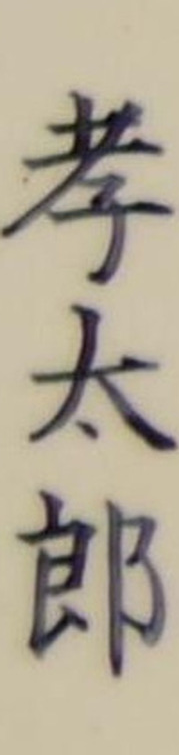孝太郎

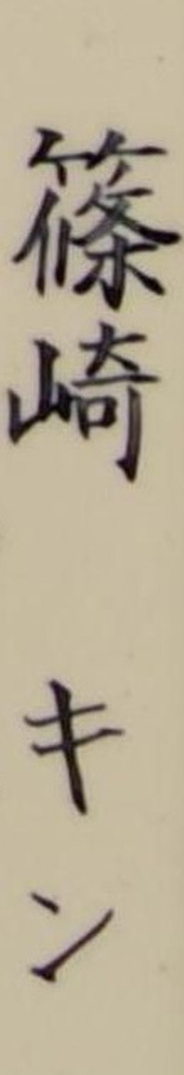篠崎キン
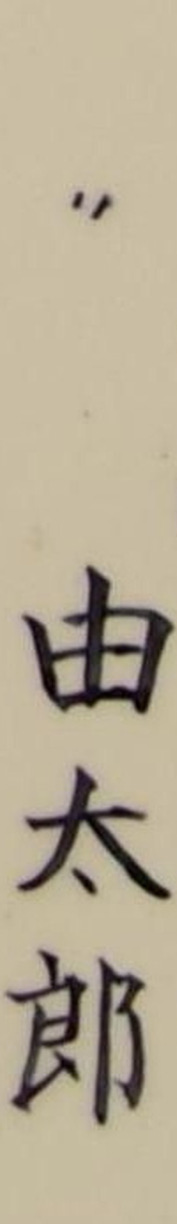由太郎
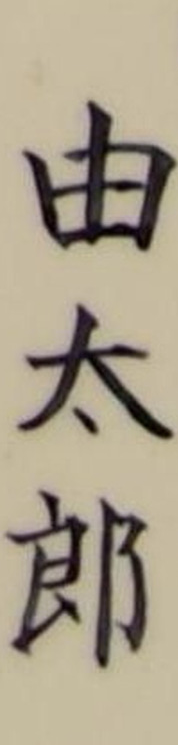由太郎
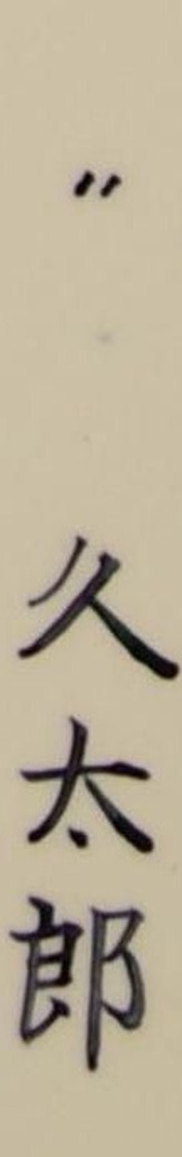久太郎
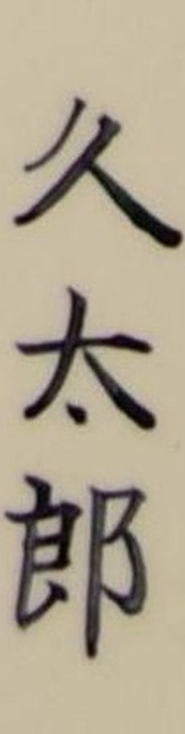久太郎
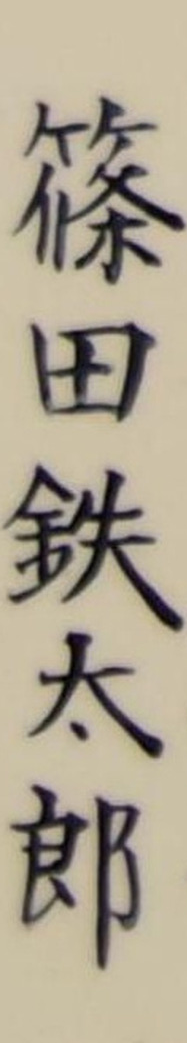篠田鉄太郎
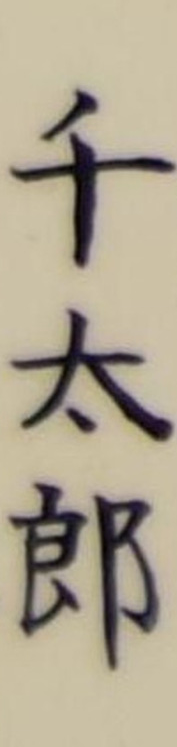千太郎
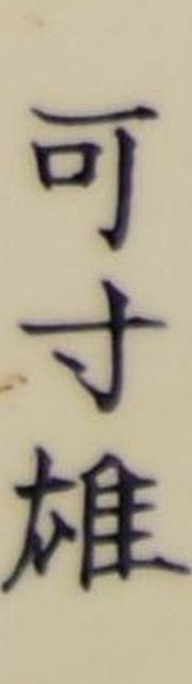可寸雄
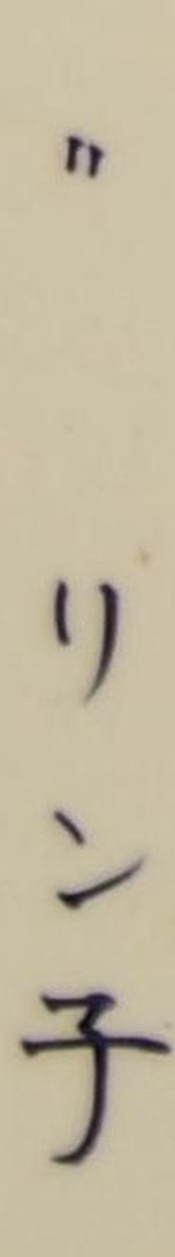リン子
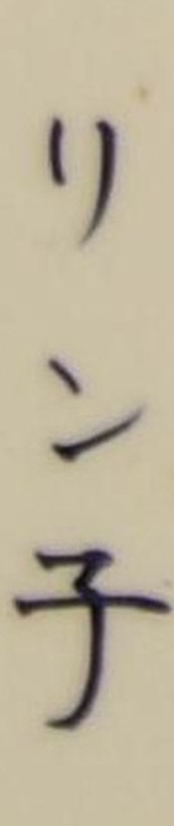リン子
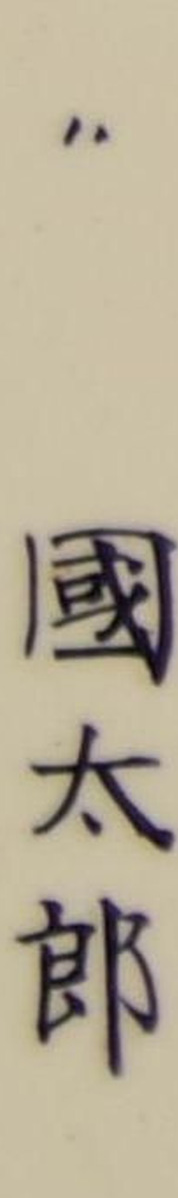由太郎
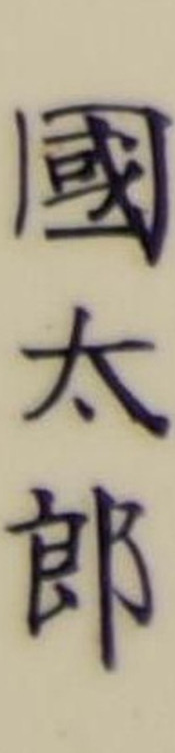由太郎
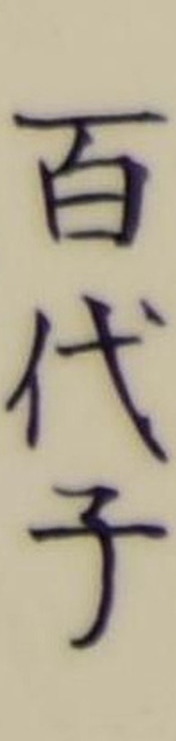百代子
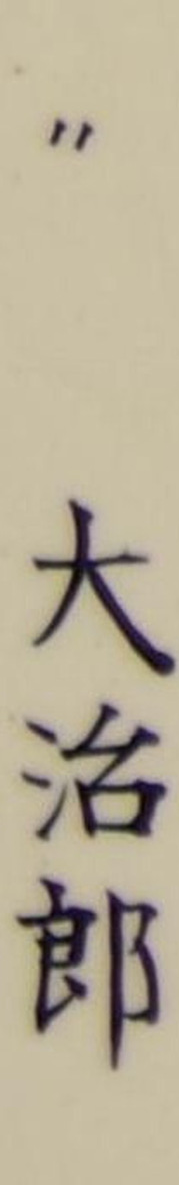大治郎
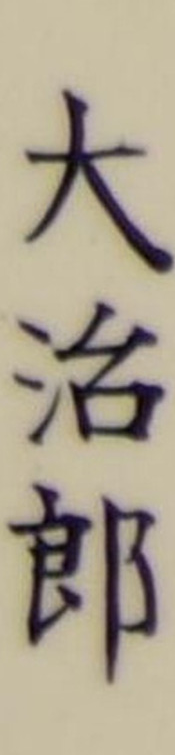大治郎
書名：A~D
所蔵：koyasan kongobuji
